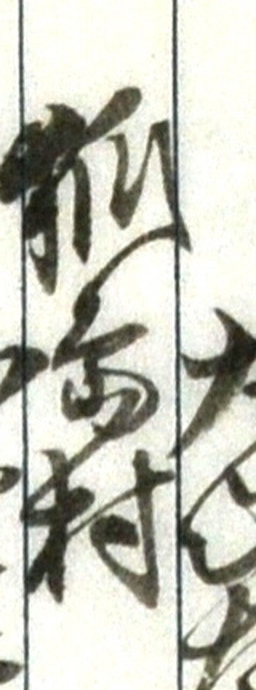狐島村
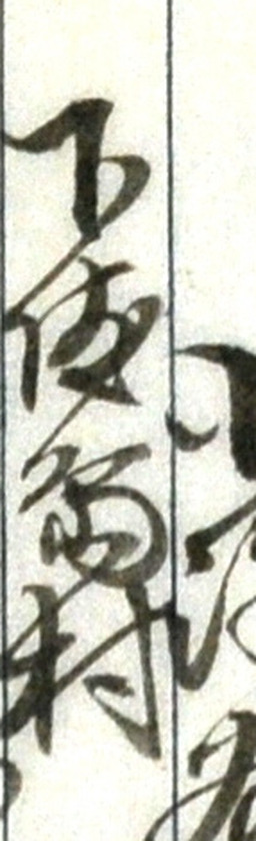下殿島村
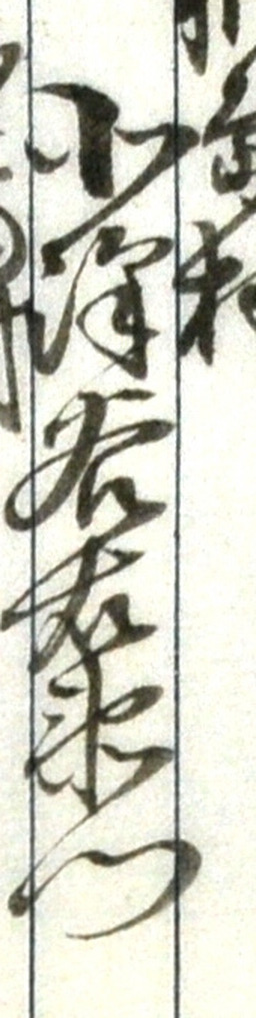小沢谷右衛門
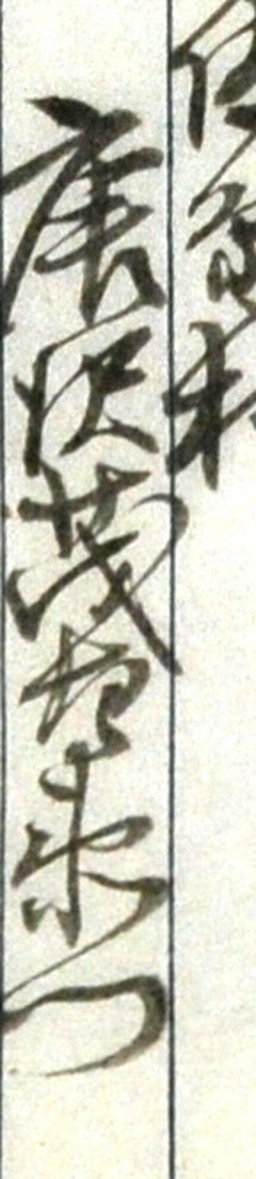唐沢茂左衛門
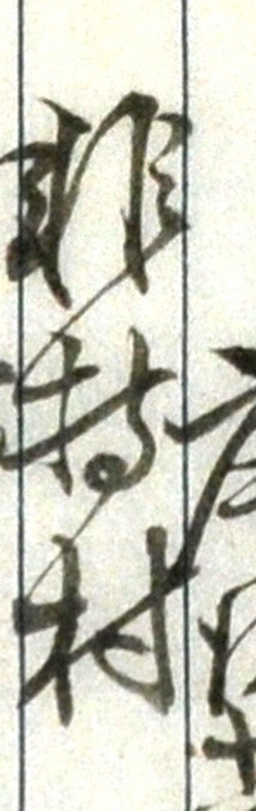非持村
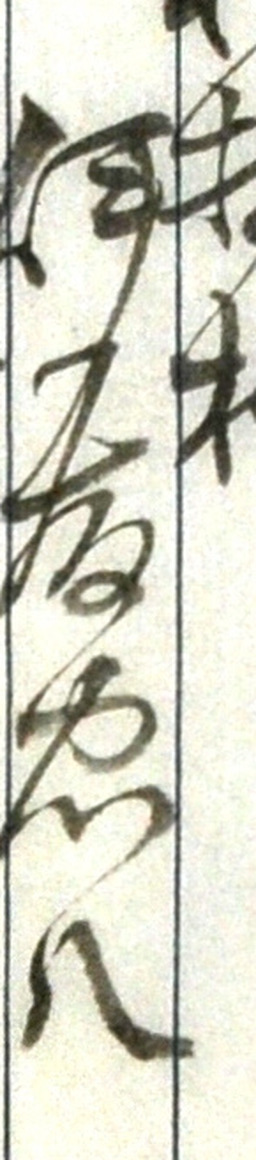伊藤忠八
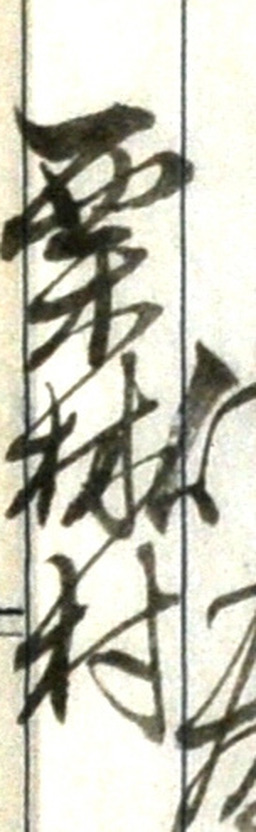栗林村

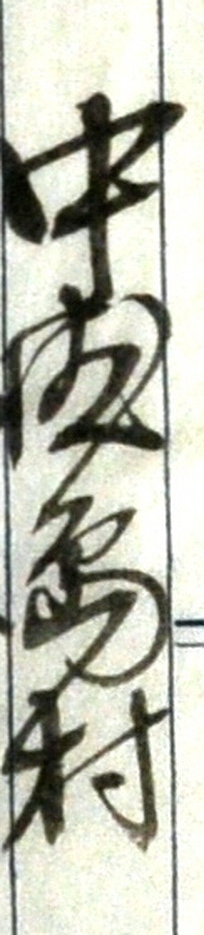中殿島村
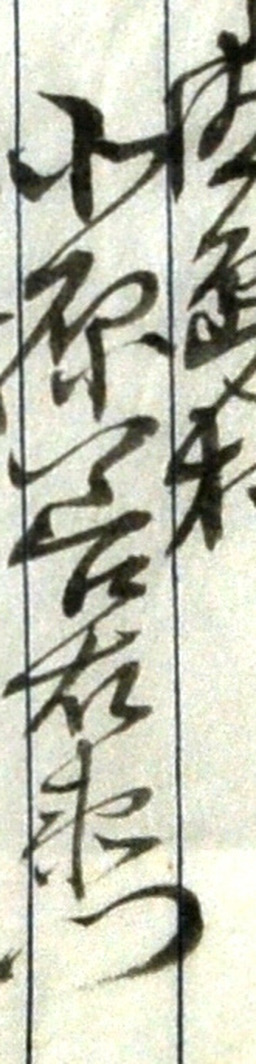北原善右衛門
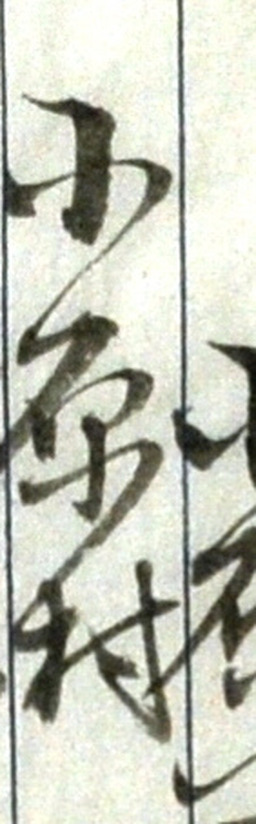小原村
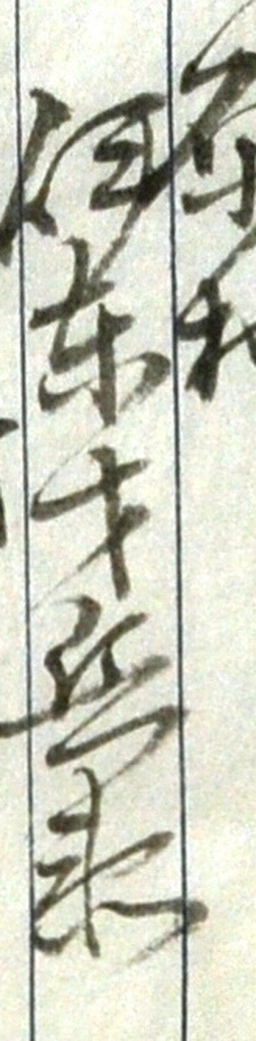伊東才兵衛
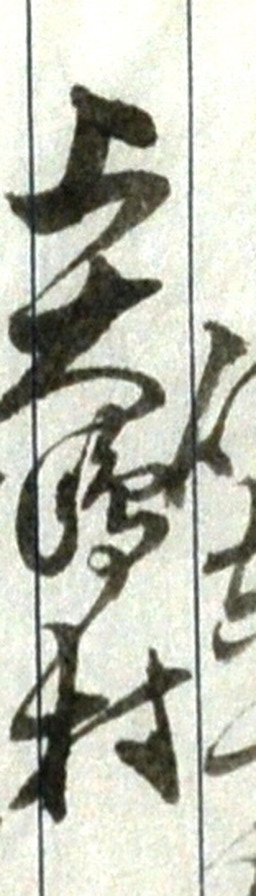上大嶋村
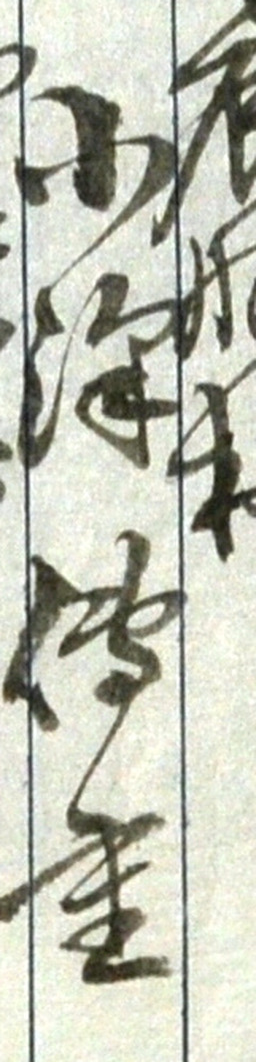小沢伝重
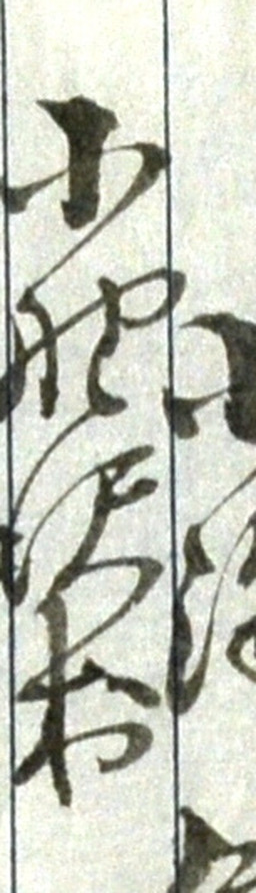小野沢村
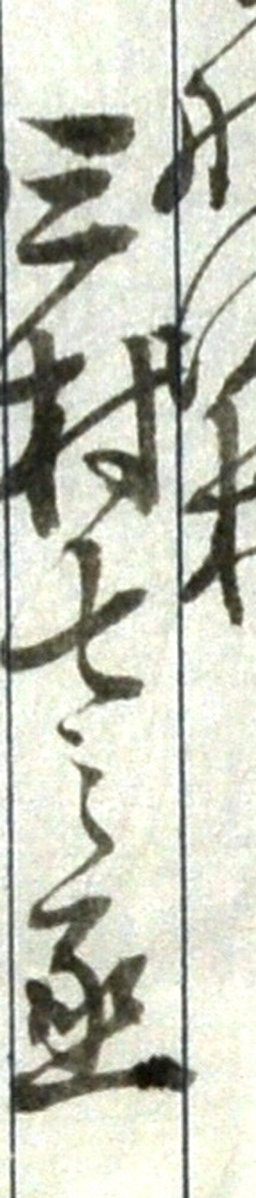三村七之丞
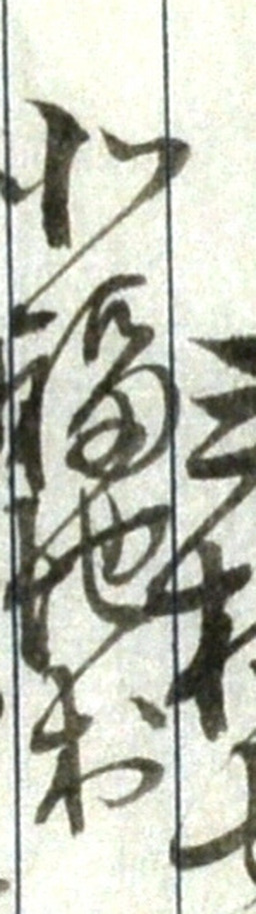北福地村
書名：大阪御進初人足数改帳（抄出）
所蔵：伊那市立高遠町図書館・合同会社AMANE
